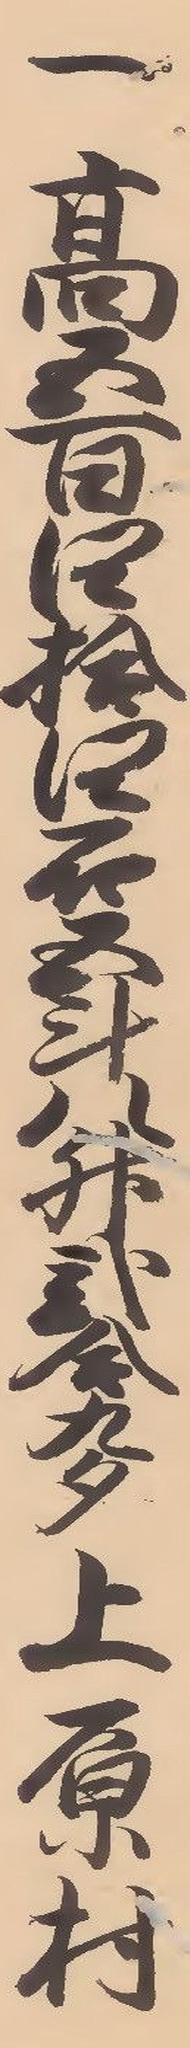一高五百四拾四石五斗八升弐合九勺上原村
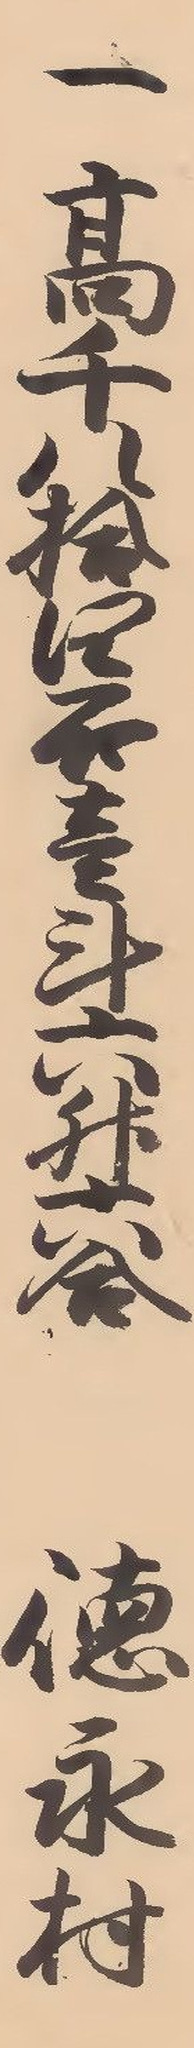一高千八拾四石壱斗六升六合徳永村
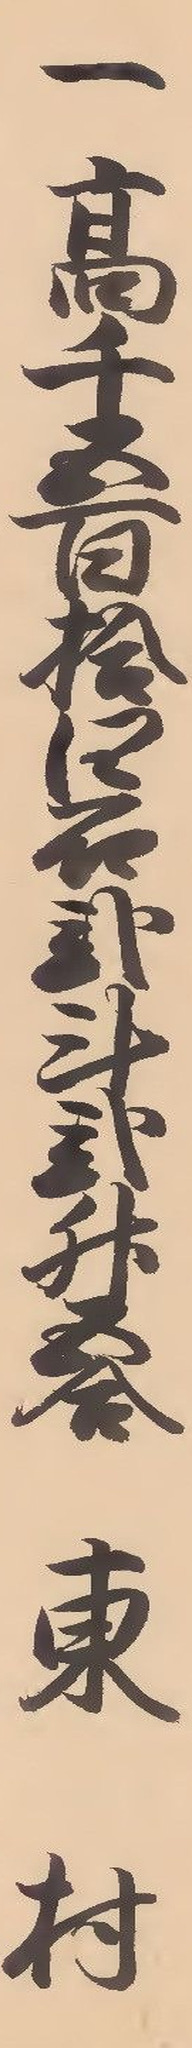一高千五百拾四石弐斗弐升五合東村
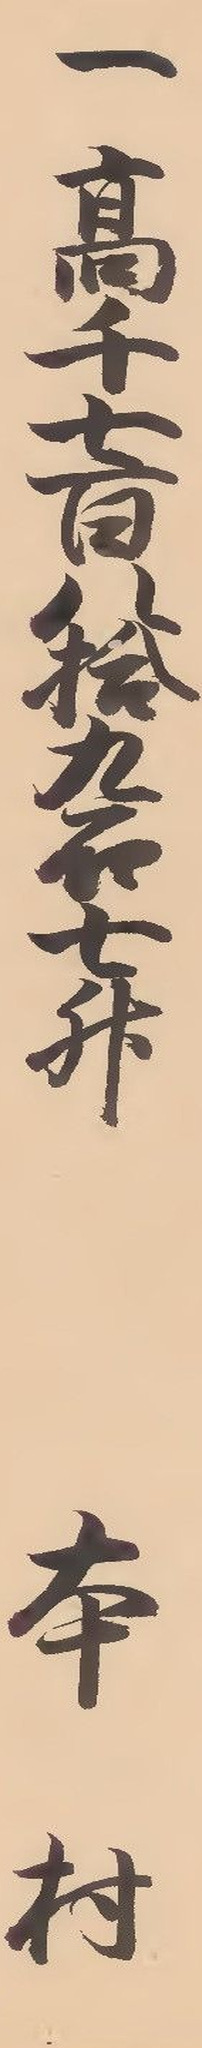一高千七百八拾九石七升本村
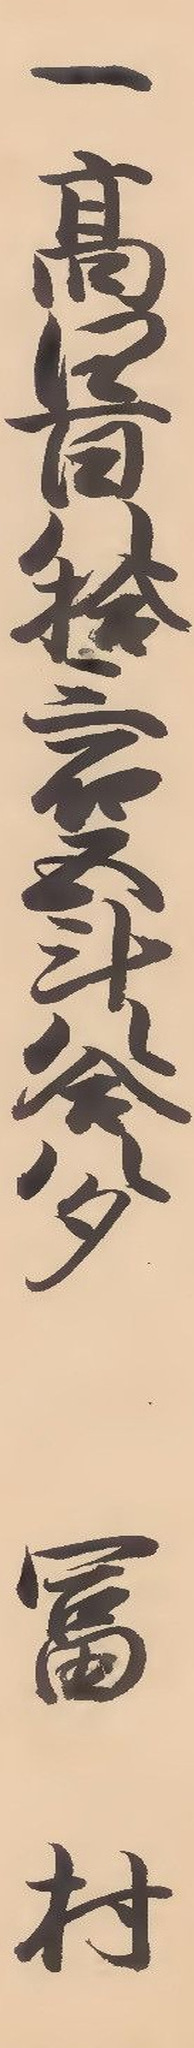一高四百八拾三石五斗八合八勺富村
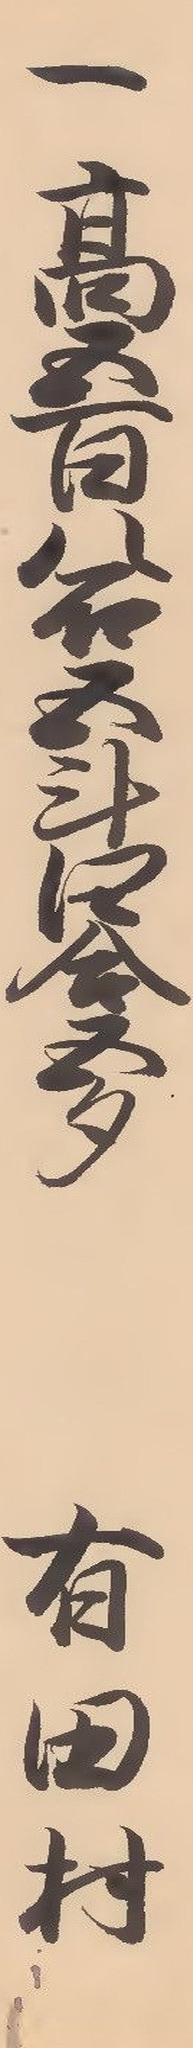一高五百八石五斗四合五勺有田村
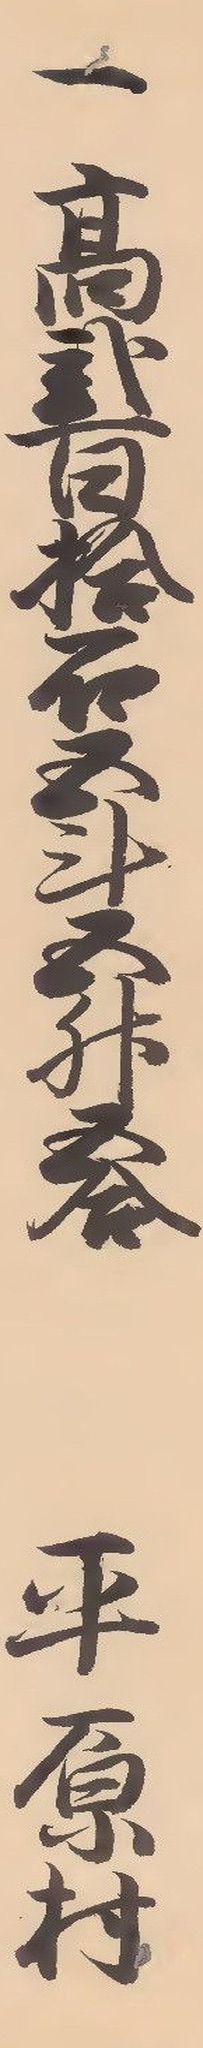一高弐百拾石五斗五升五合平原村
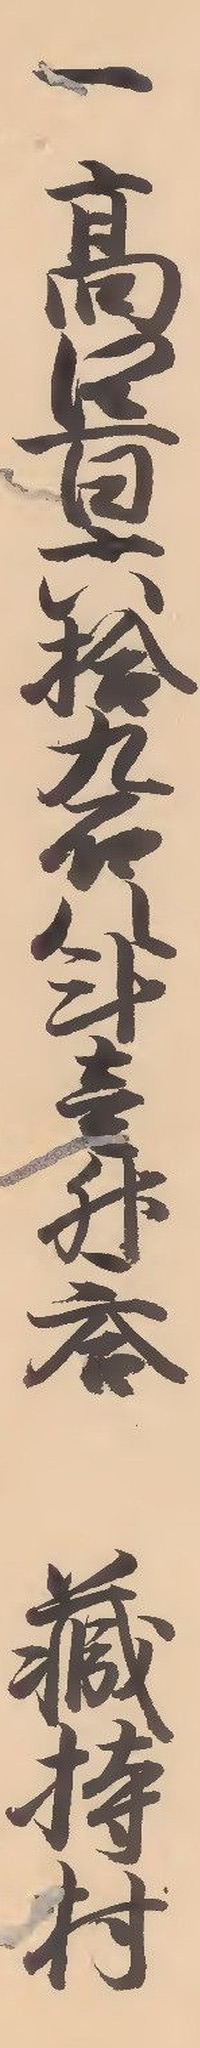一高四百六拾九石八斗壱升三合蔵持村

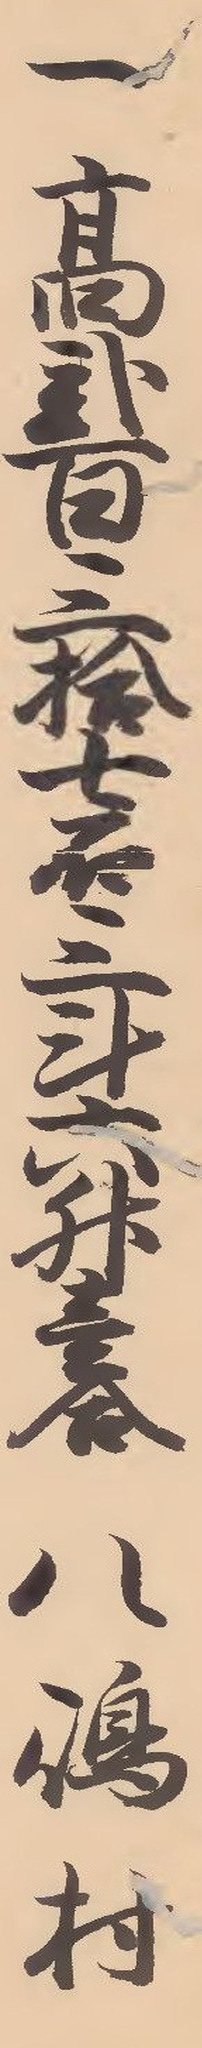一高弐百三拾七石三斗六升壱合八島村
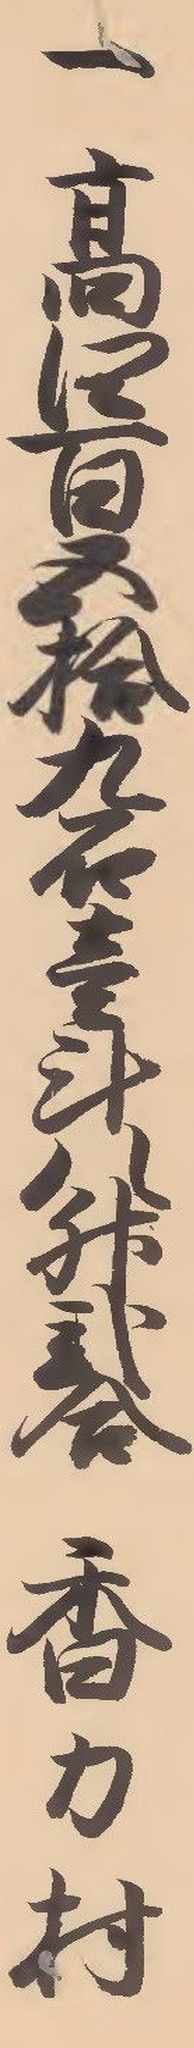一高四百五拾九石壱斗八升弐合香力村
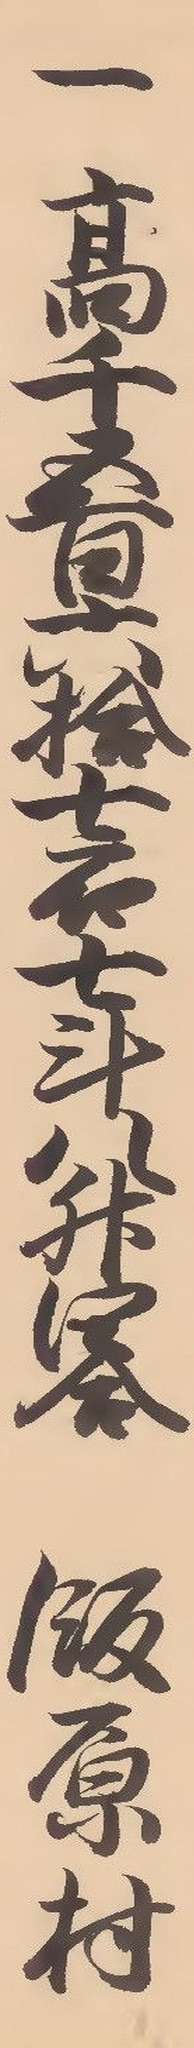一高千五百六拾七石七斗八升四合飯原村
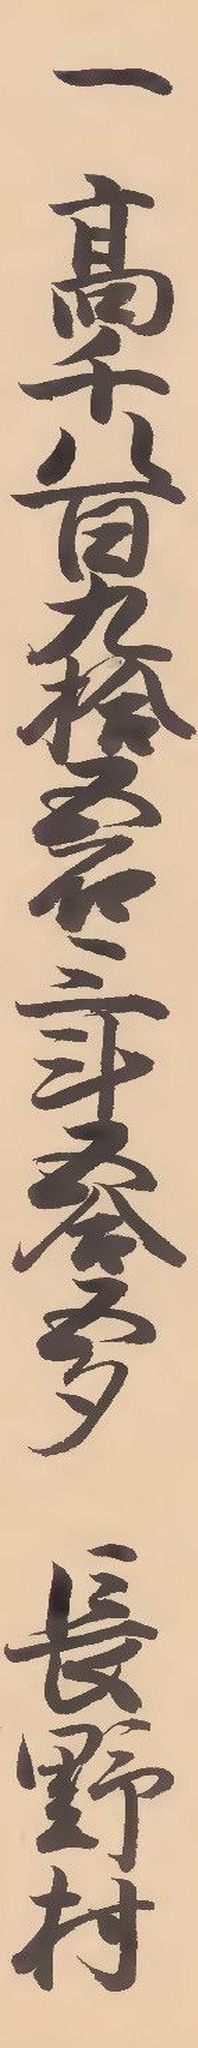一高千八百九拾五石三斗五合五勺長野村
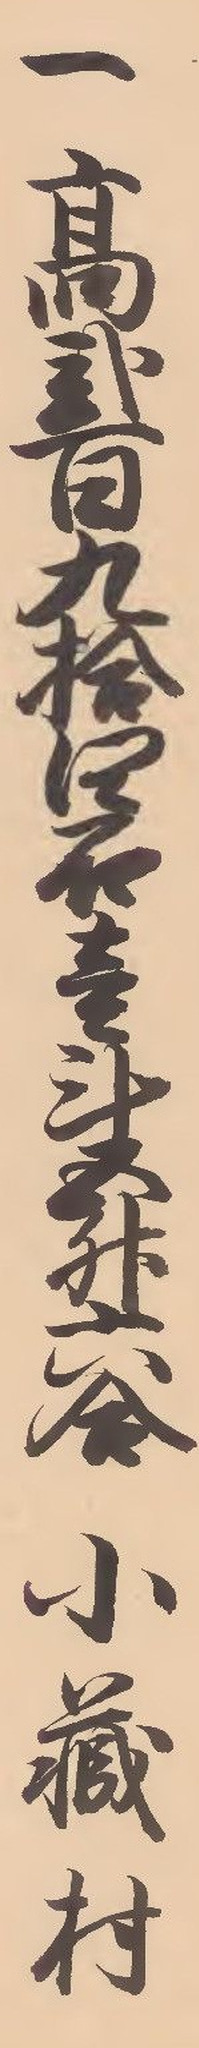一高弐百九拾四石壱斗五升六合小蔵村
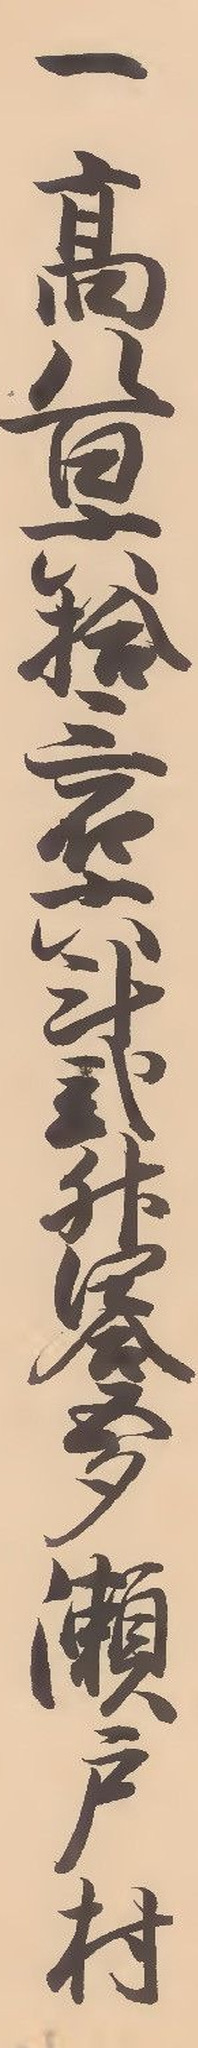一高八百六拾三石六斗弐升四合五勺瀬戸村
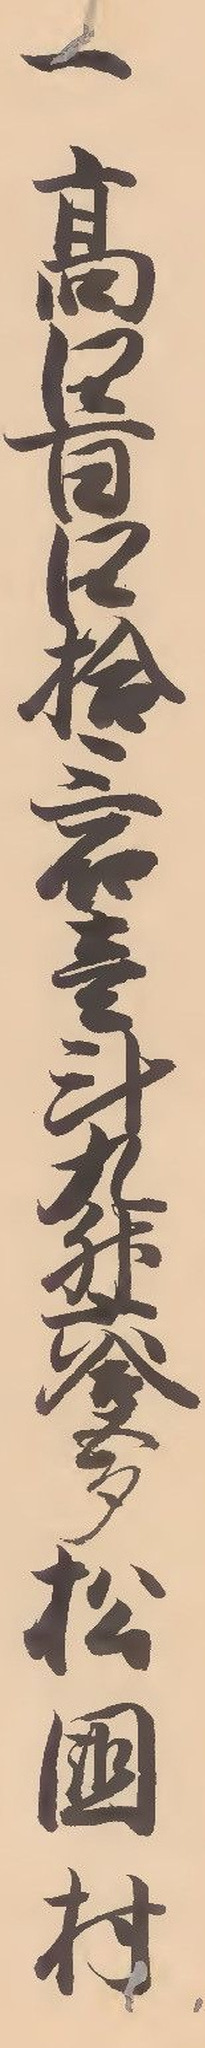一高四百四拾三石壱斗九升六合五勺松国村
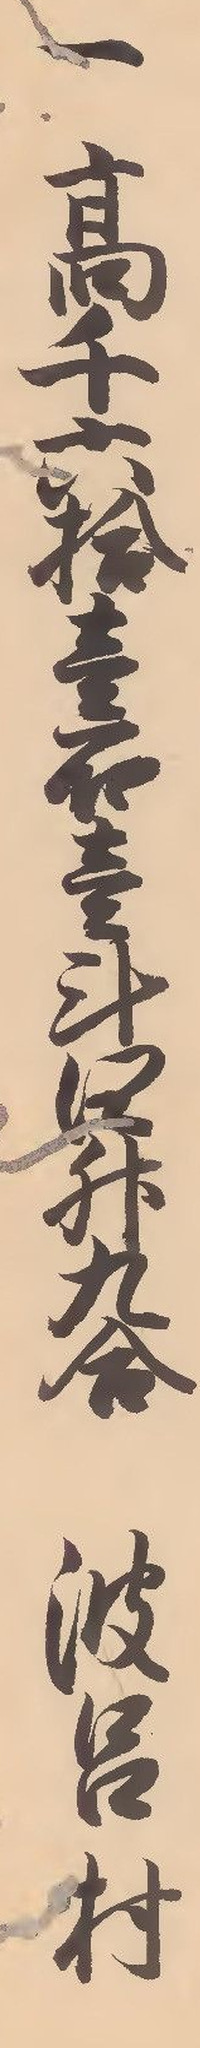一高千六拾壱石壱斗四升九合波呂村
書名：筑前国郷帳
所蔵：国立公文書館 National Archives of Japan
